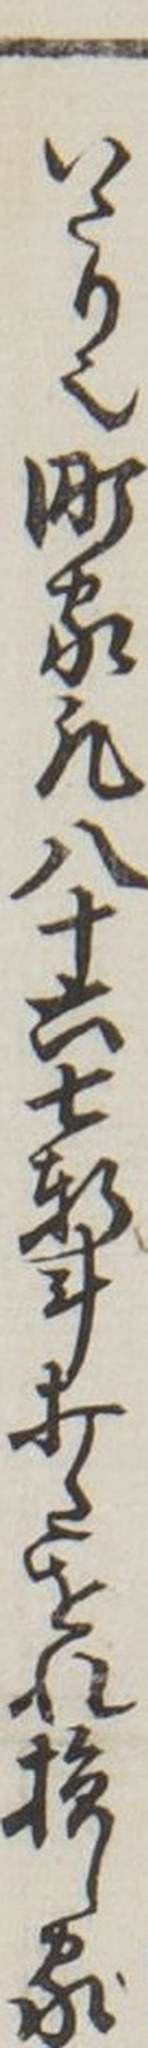いたり也町家凡八十六七軒計打たをれ損し家
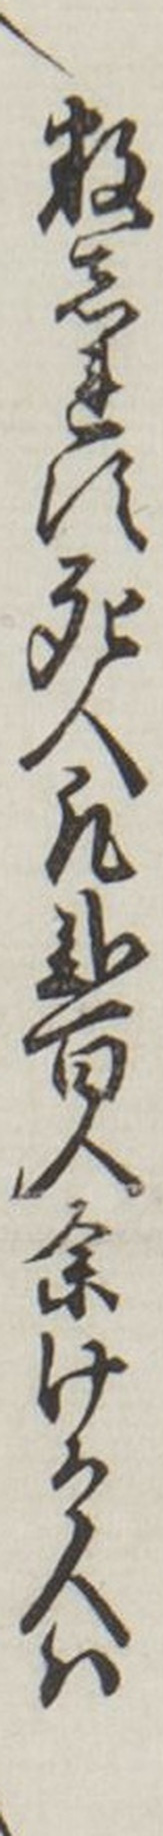数しれす死人凡弐百余けか人は
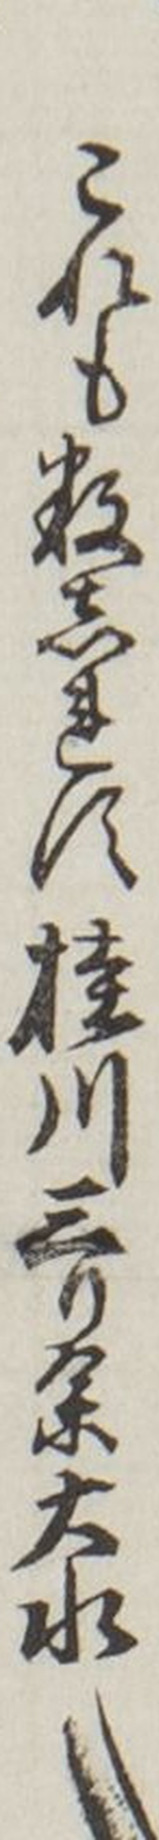これも数しれす桂川三り余大水
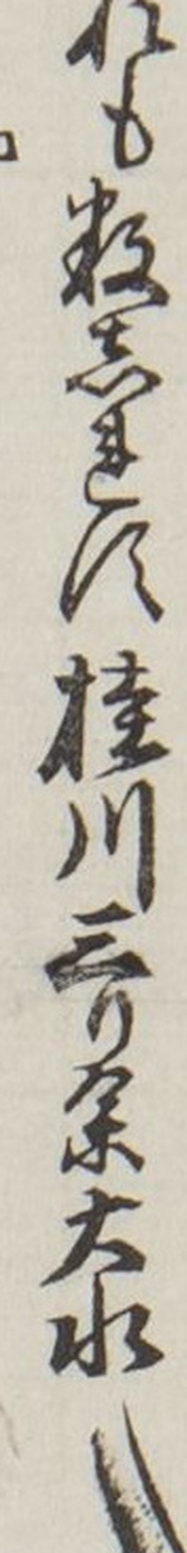これも数しれす桂川三り余大水
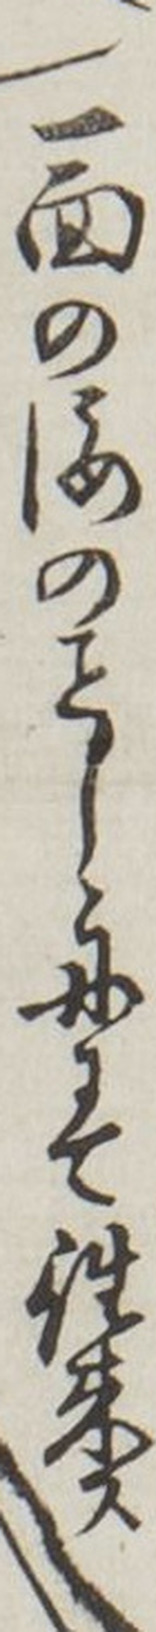一面の海のことしと舟にて往来す
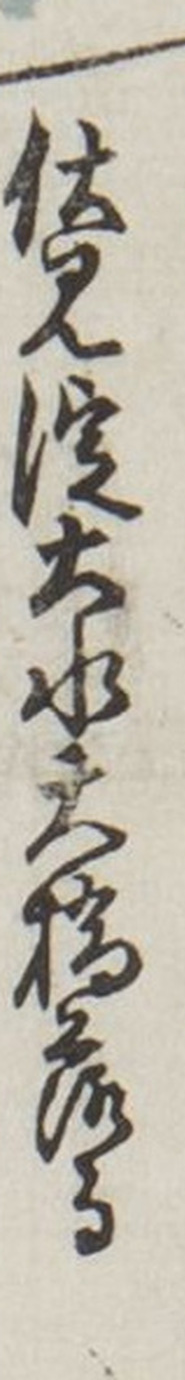伏見淀大水大橋落る
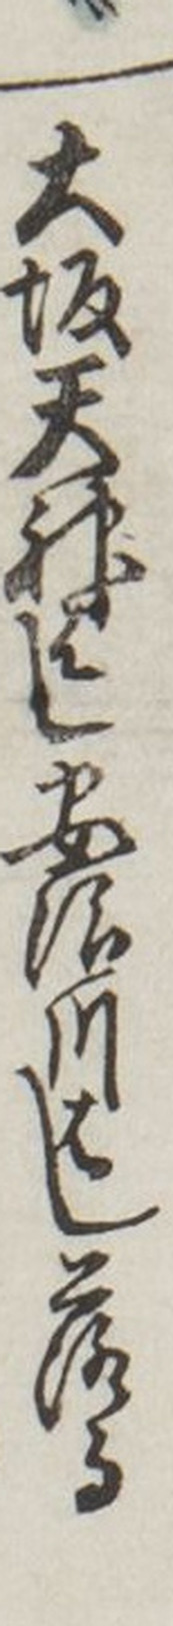大坂天神はし安治川はし落る
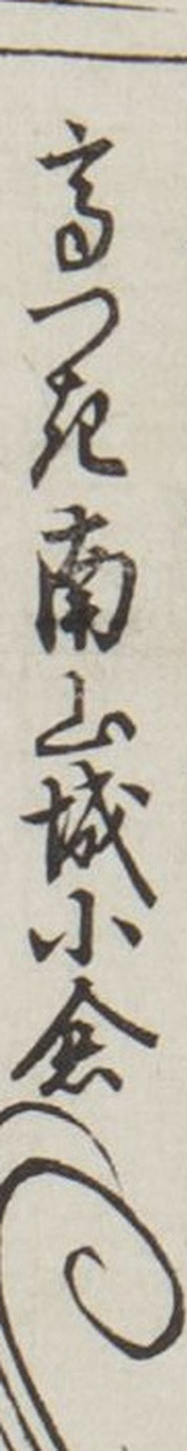高つき南山城小倉
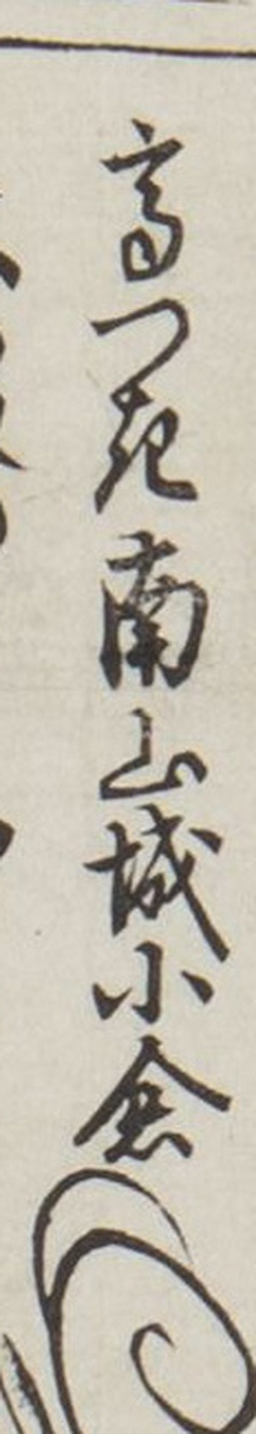高つき南山城小倉
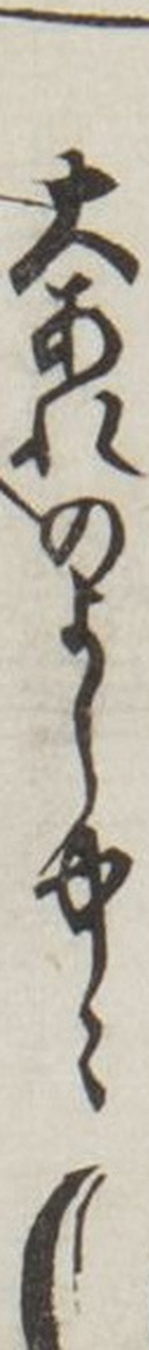大あれのよし中々
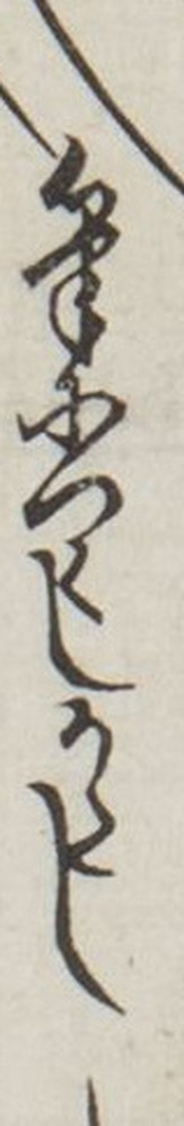筆につくしかたし
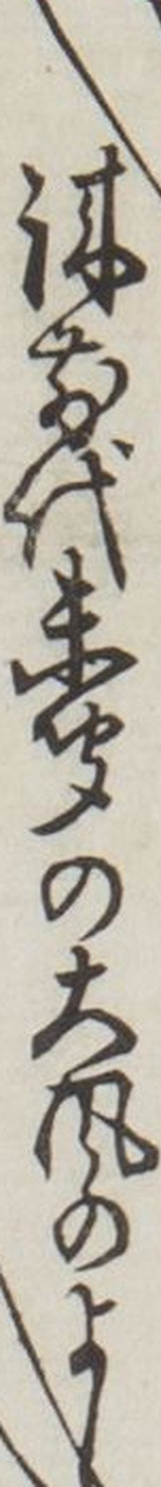誠前代未聞の大風のよし
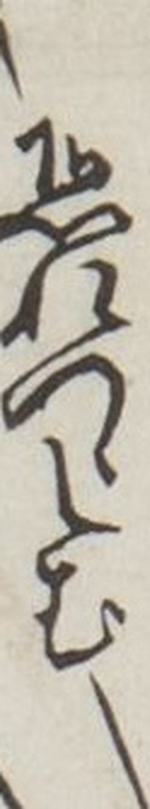恐れつゝしむ
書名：慶応二年京坂地方大風雨之図
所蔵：あいおいニッセイ同和損保株式会社
